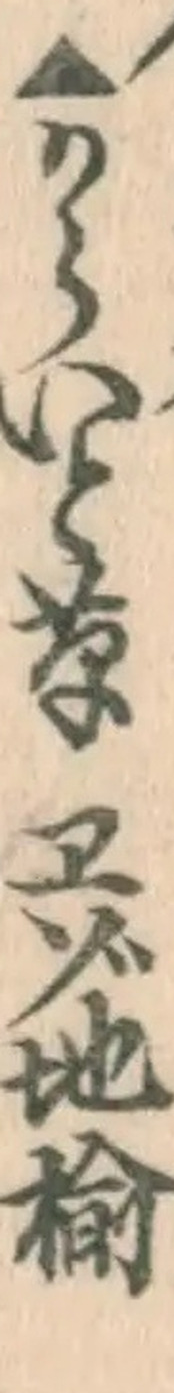▲からいと草エゾ地
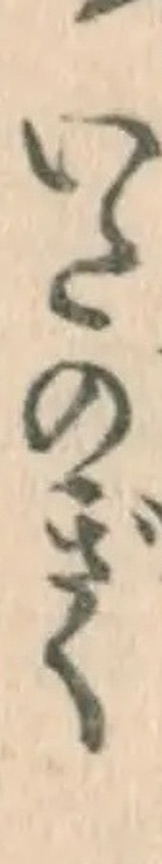いたのぎく
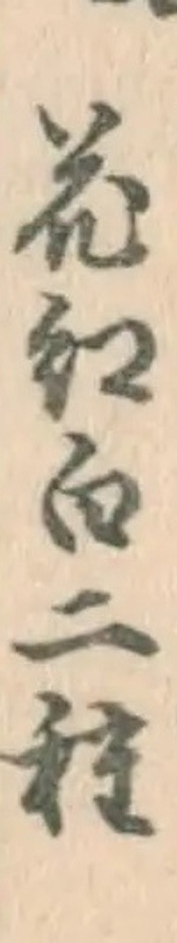花紅白二種
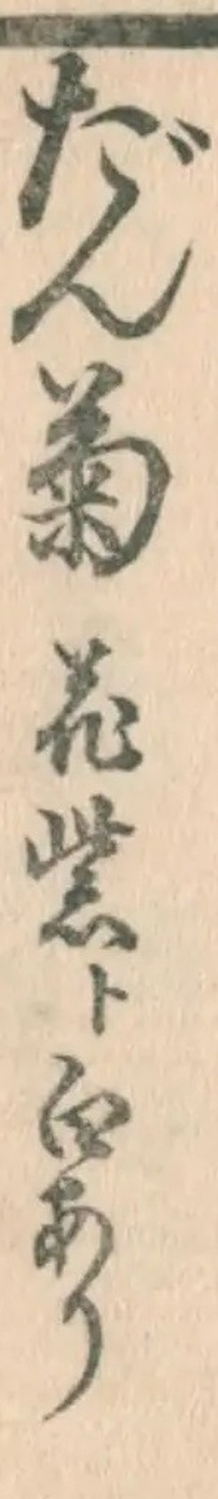だん菊花紫ト白あり
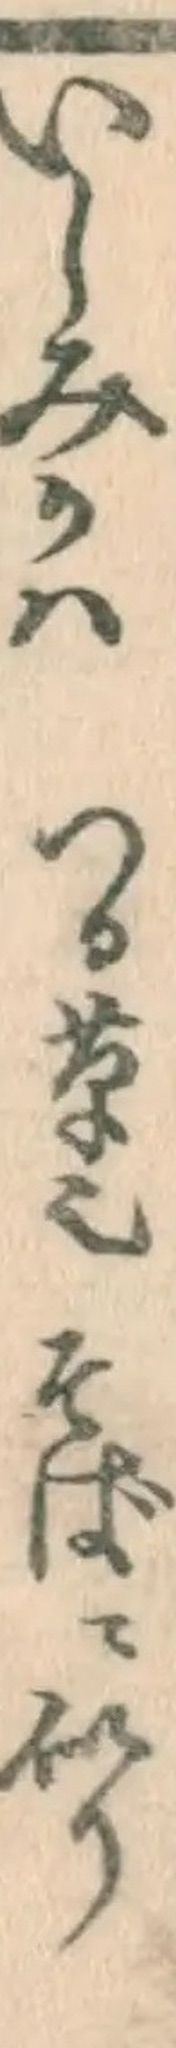いしみかハつる草也そば似り
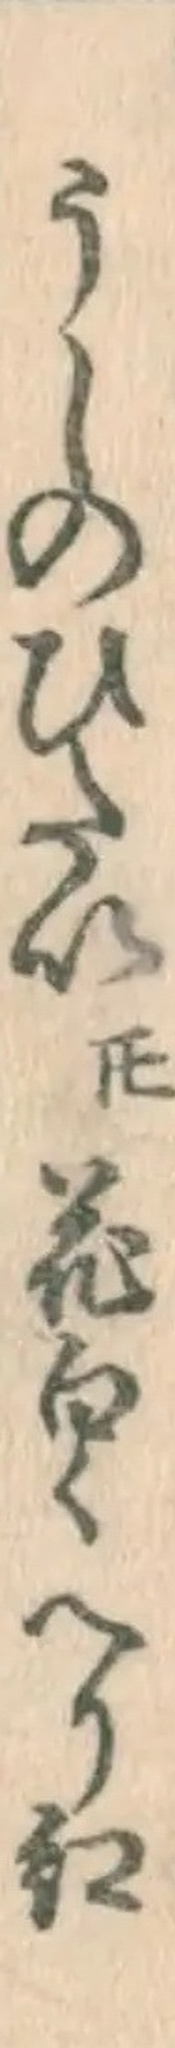うしのひたい共花白くへり紅
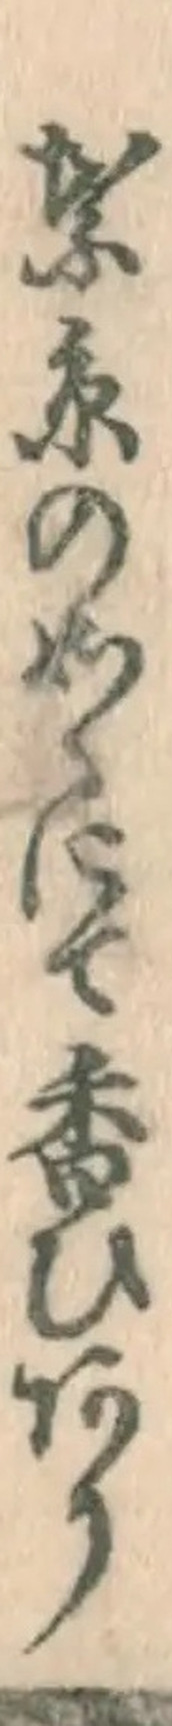葉糸のやうにて香ひあり
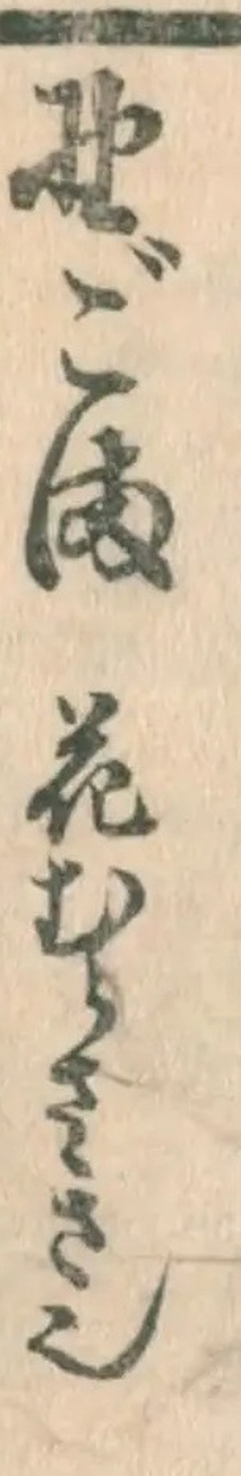野ごま花むらさき也
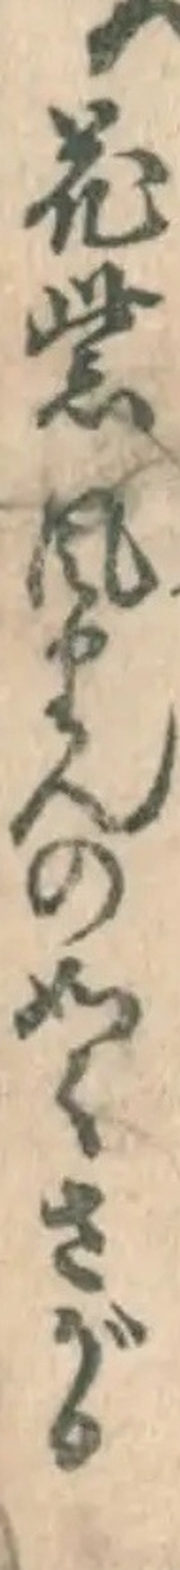花紫風りんのごとくさがる

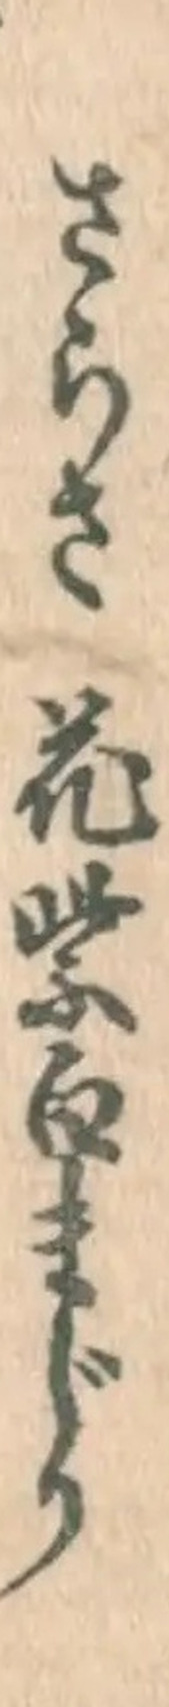さらさ花紫白まじり
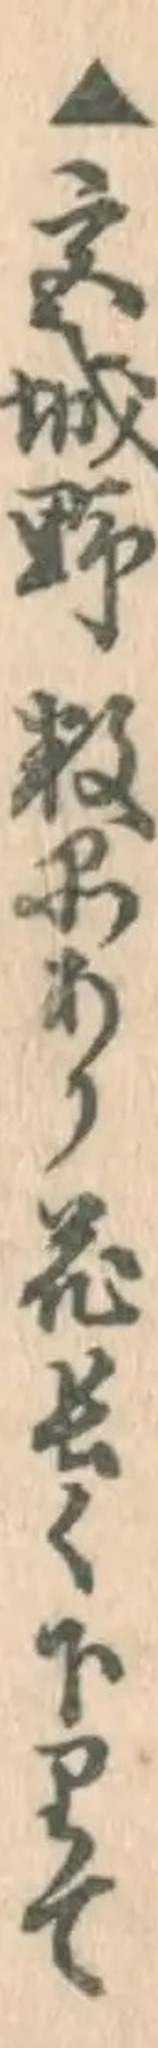▲宮城野数品あり花長く下りて
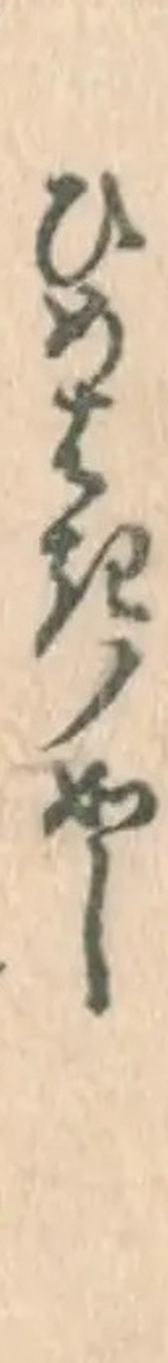ひめはきノ如し
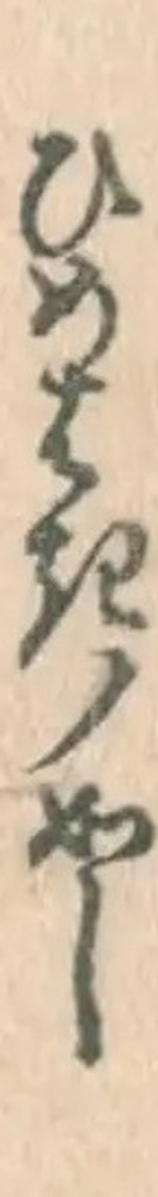ひめはきノ如し
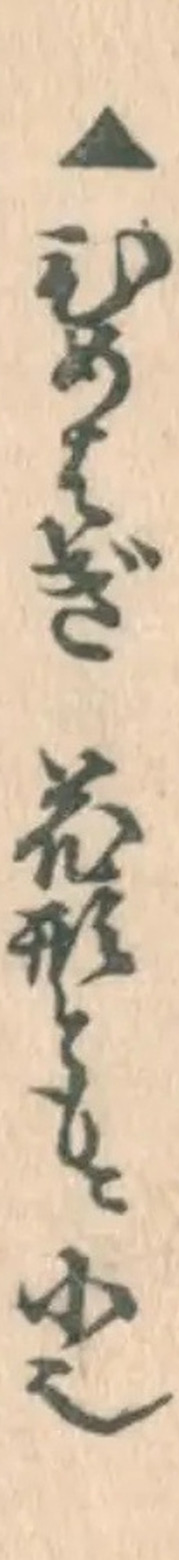▲むめはぎ花形ともに小也
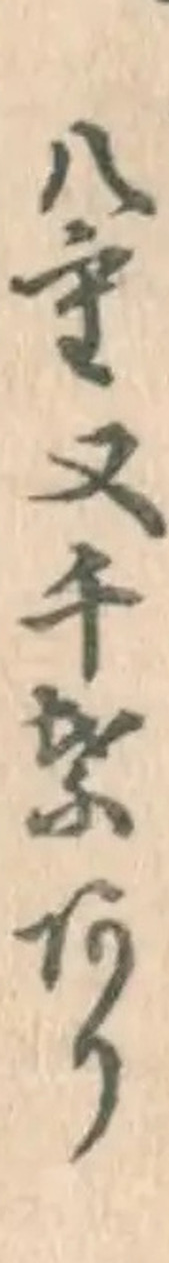八重又千葉あり
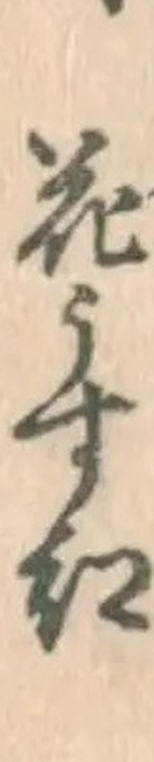花うす紅
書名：茶席挿花集
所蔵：国立国会図書館 National Diet Library, JAPAN
